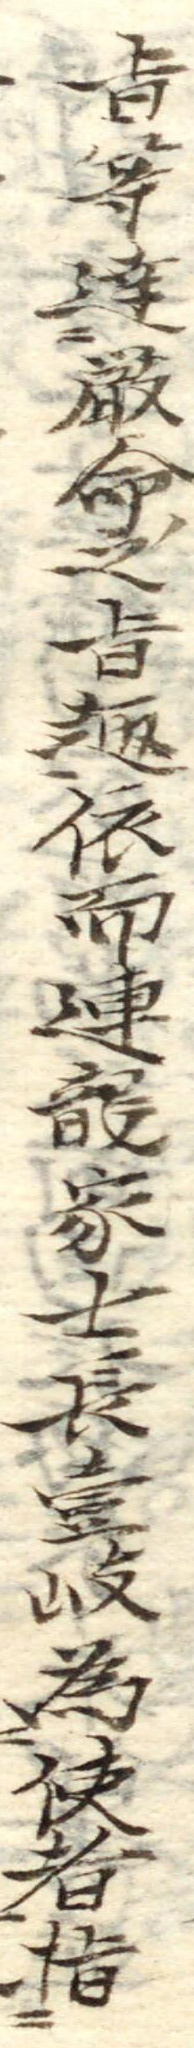旨等達厳命之旨趣依而連龍家士長壹岐為使者指
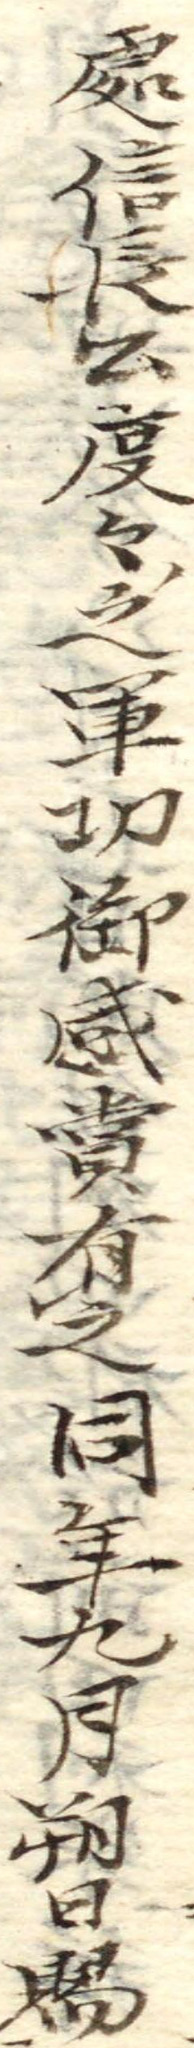處信長公度々之軍功御感賞有之同年九月朔日賜
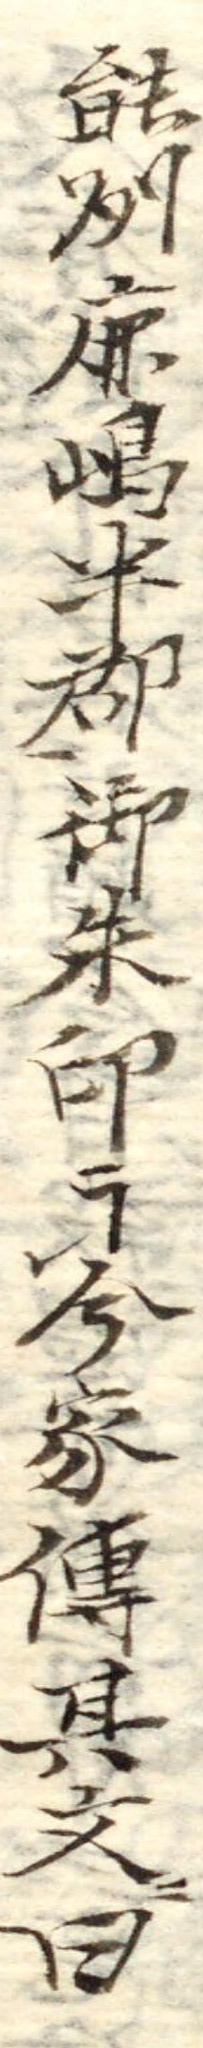能州鹿島半軍御朱印干今家傳其文に曰
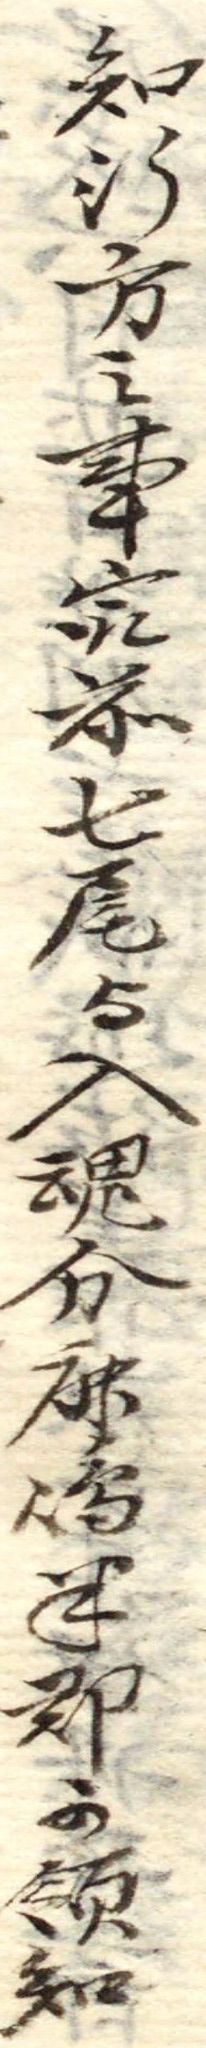知行方之事最前七尾与入魂分鹿島半郡可領知
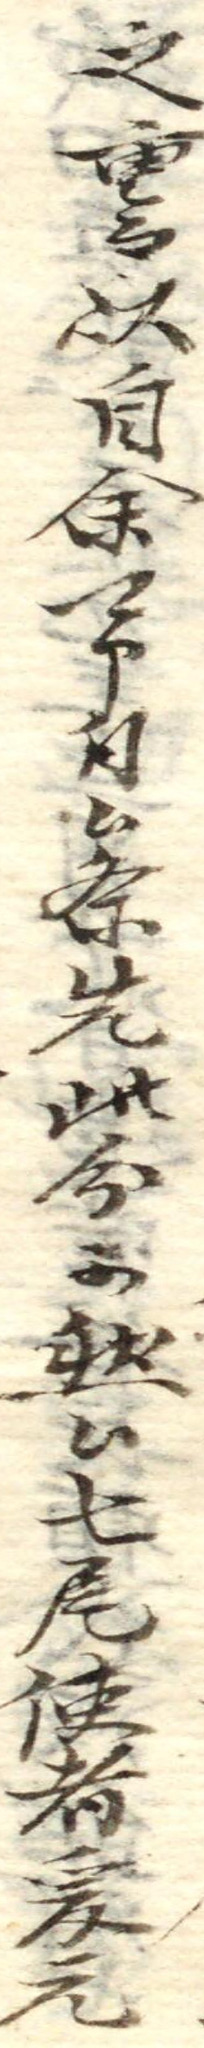之重而以自余可申付候条先此分可然候七尾使者爰元
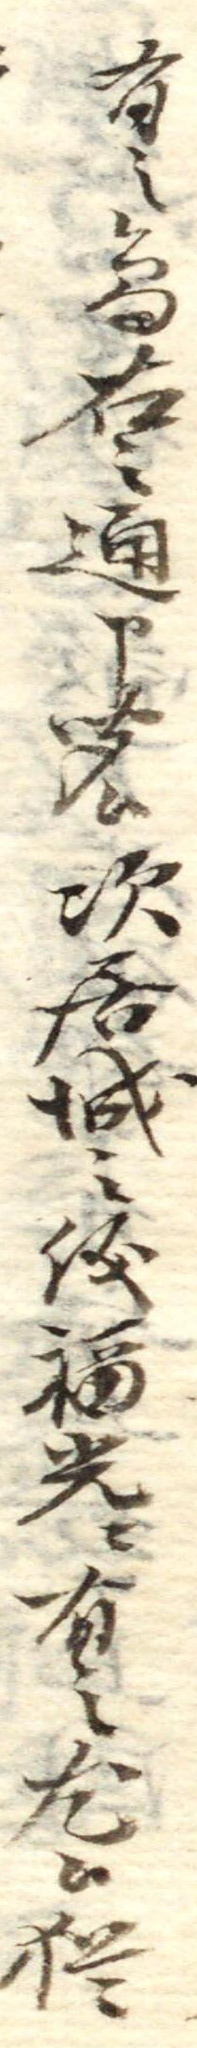有之候間右之通申聞候須居城之儀福光に有之尤候猶
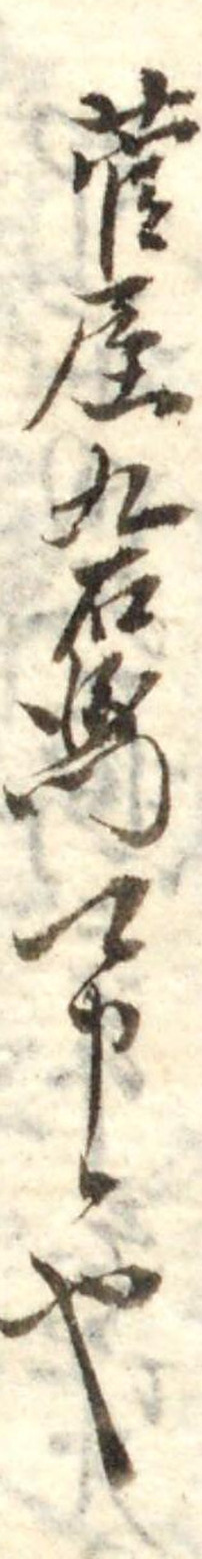菅屋九右衛門可申候也
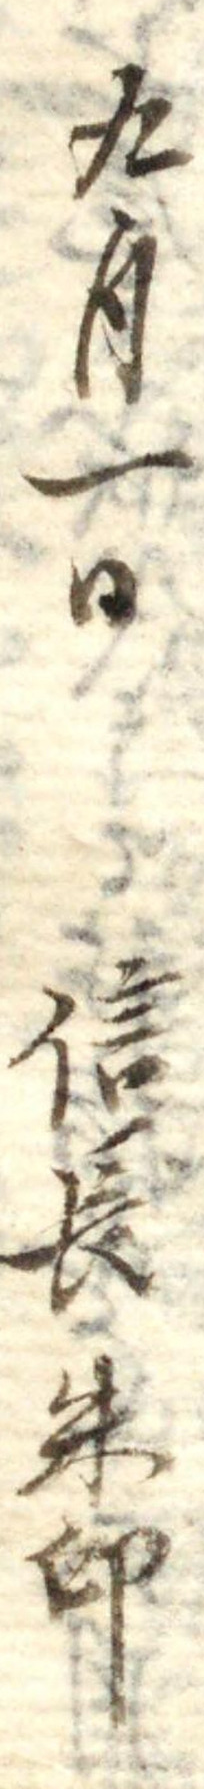九月一日信長朱印
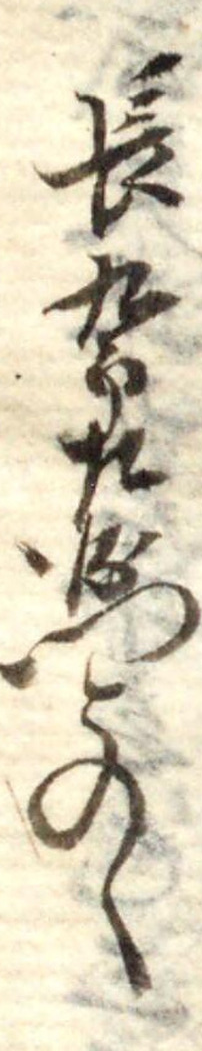長九郎左衛門とのへ

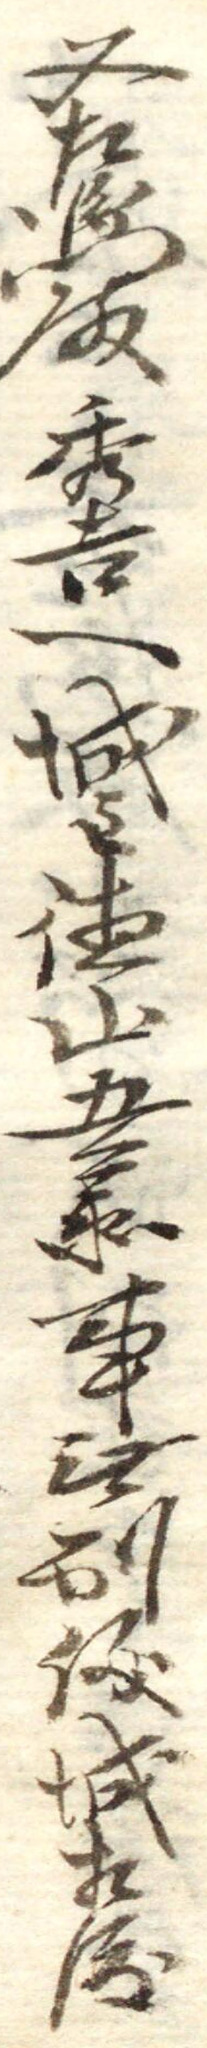又左衛門殿秀吉へ城主徳山五兵衛事無別義城相渡
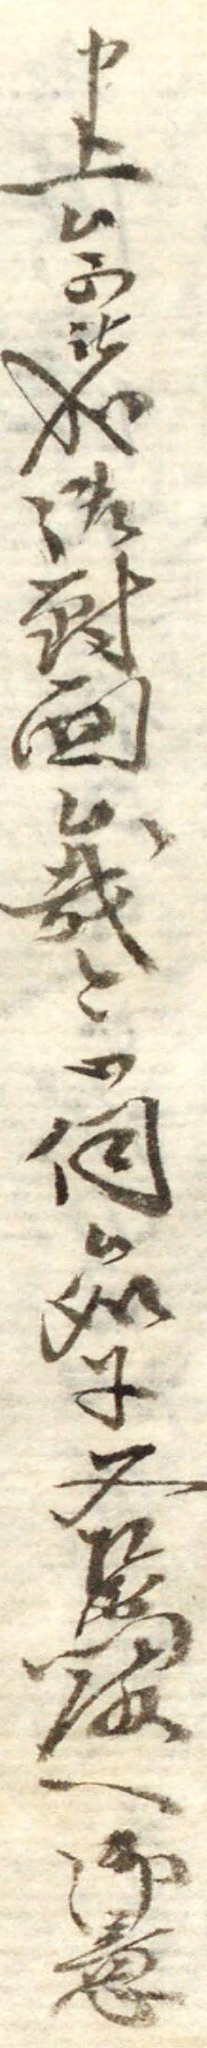申上候可被成御対面候哉と御伺候処尓又左衛門殿へ御意
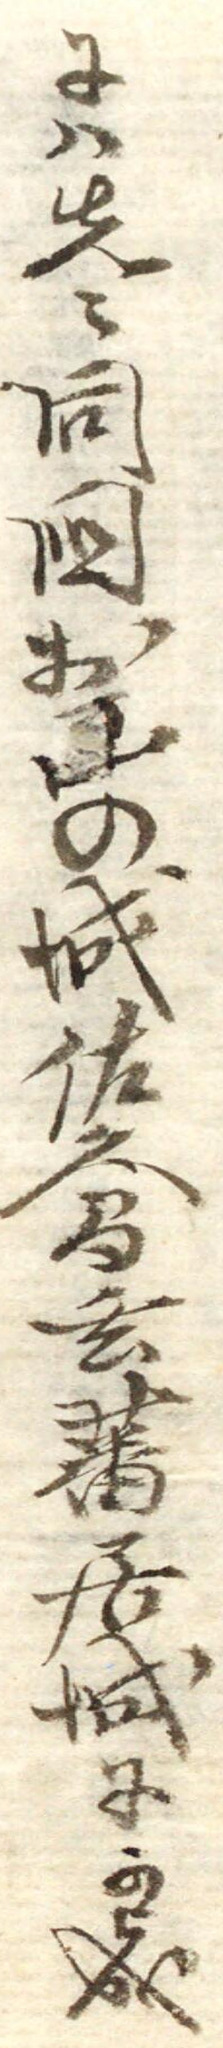尓は先々同国お山の城佐久間玄蕃居城尓可被成
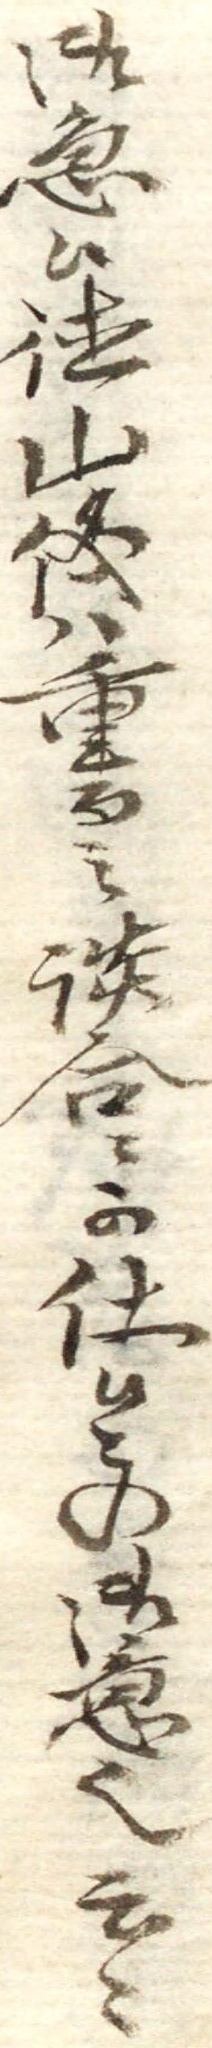御急候徳山儀は重而之談合に可仕候との御意也云々
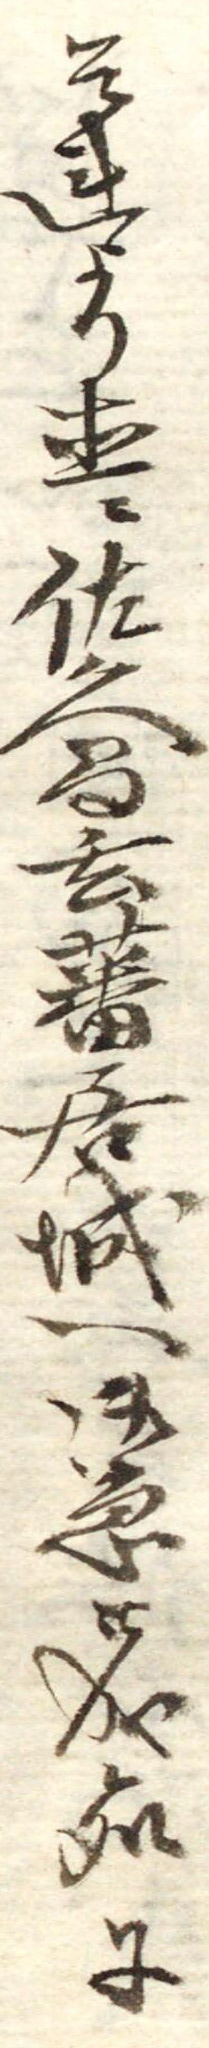そ連より直に佐久間玄蕃居城へ御急被成候処尓
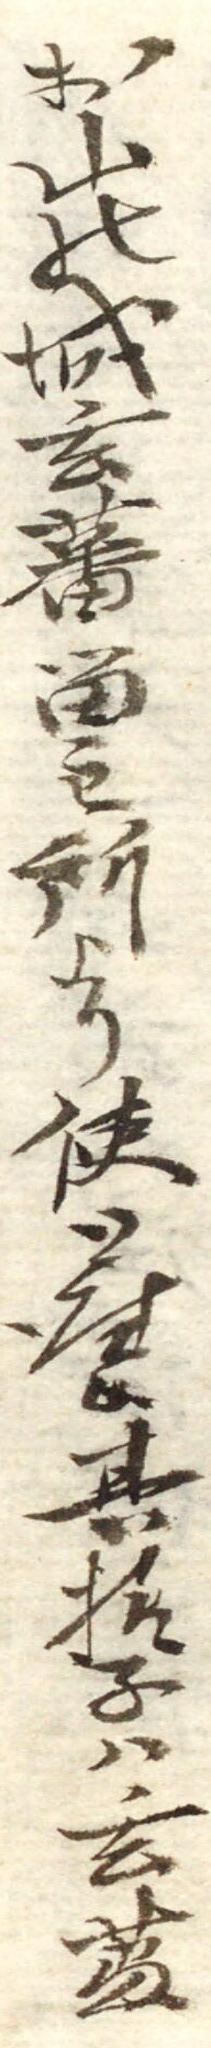お山能城玄蕃留主所より使御座候其様子は玄蕃
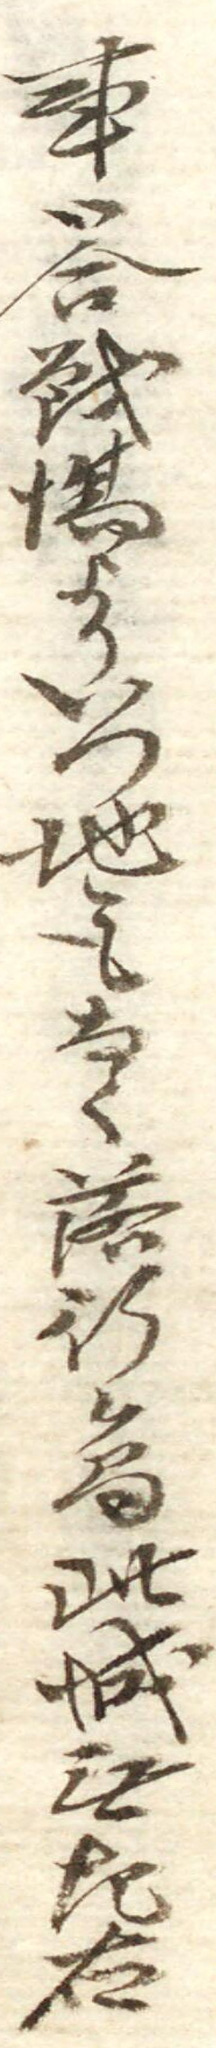事御合戦場よりいつ地ともなく落行候間此城無左右
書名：前田家封国証書集録
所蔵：Ishikawa Prefectural Library
